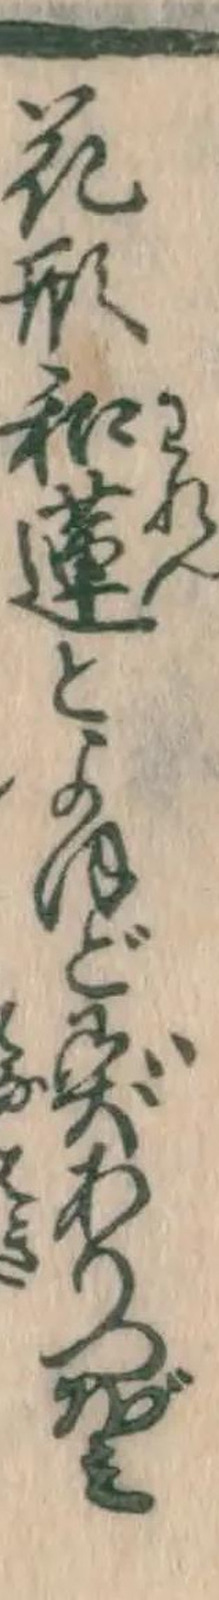花形和蓮とよほど異ありつぼみ
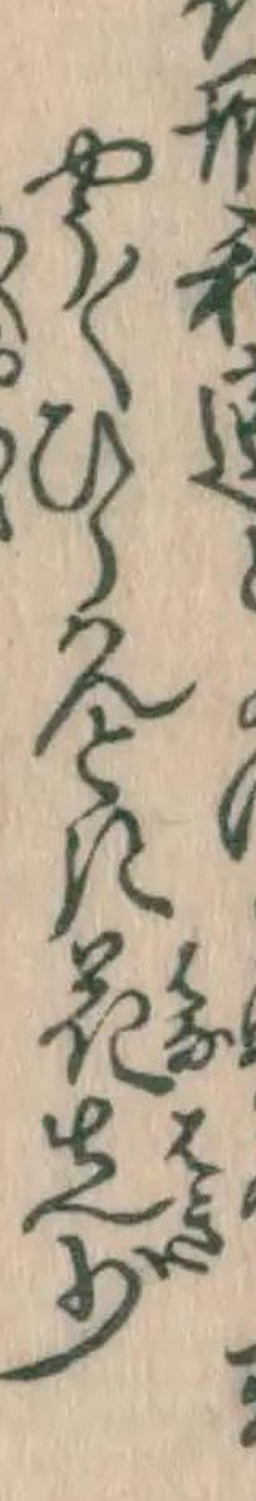やう〳〵ひらかんとす花先少
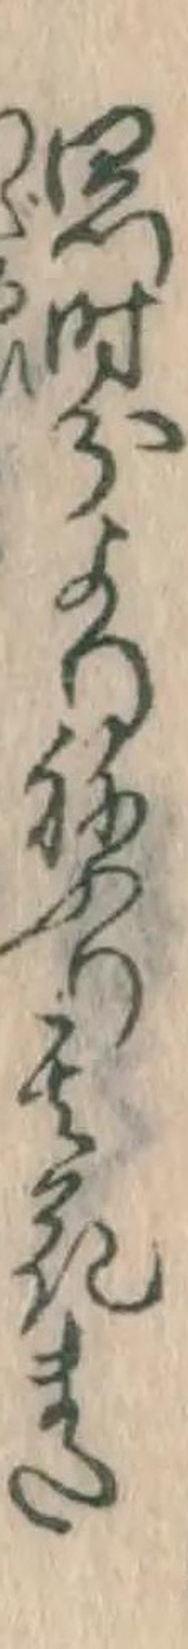四ツ時分よりねふり其花また
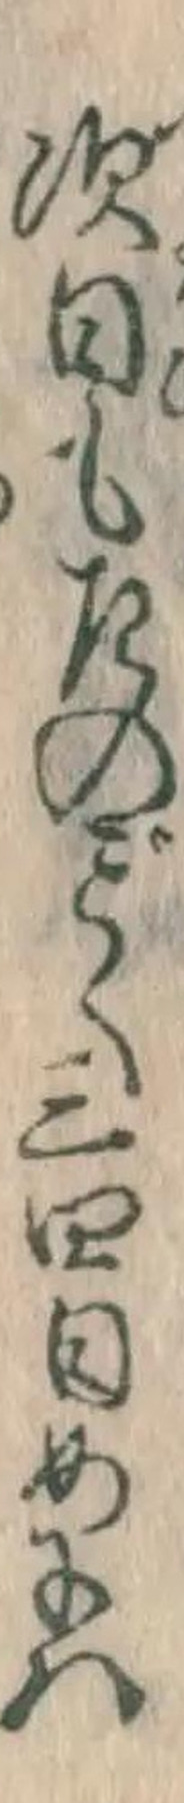次日も左のごとく三四日めには
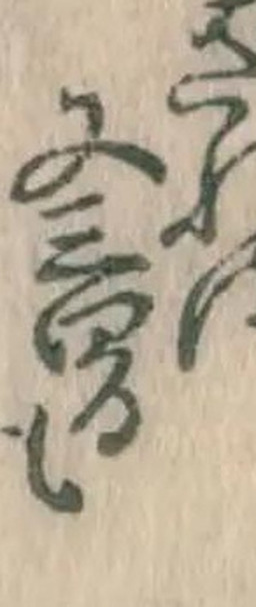又三四日も
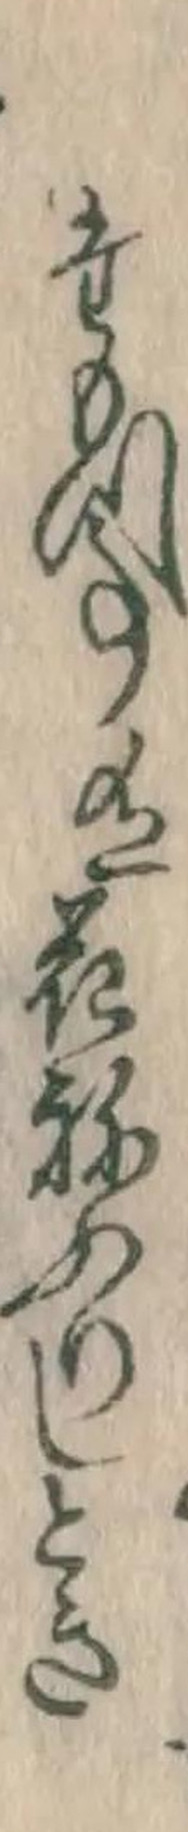たもつ事有花ねふりしとき
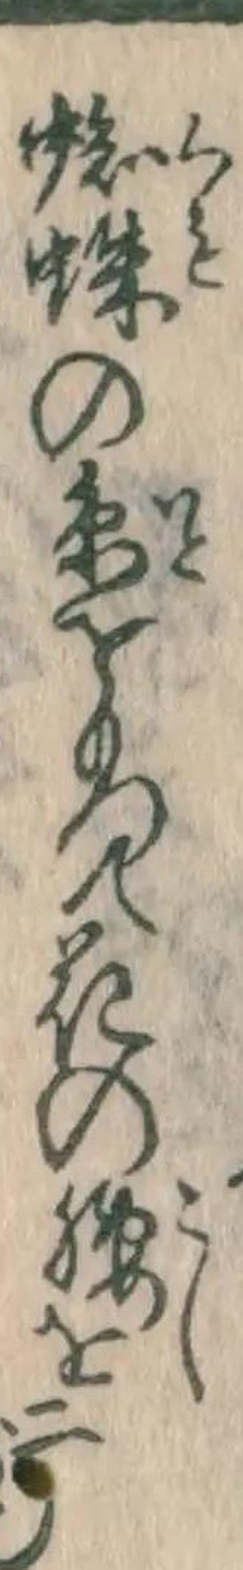蜘蛛の糸をもつて花の腰を二
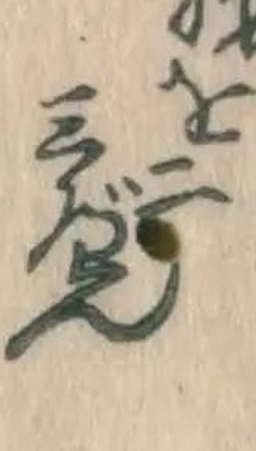三べん
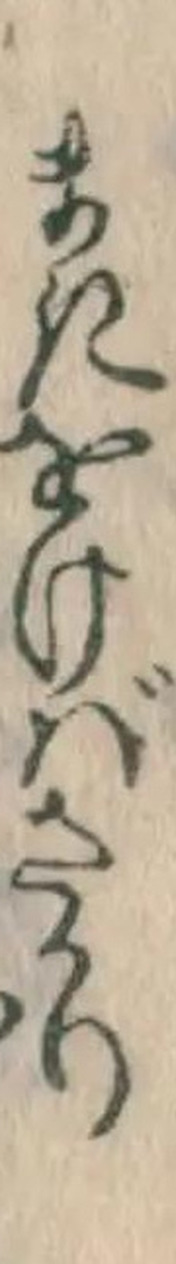まきをけばさかり
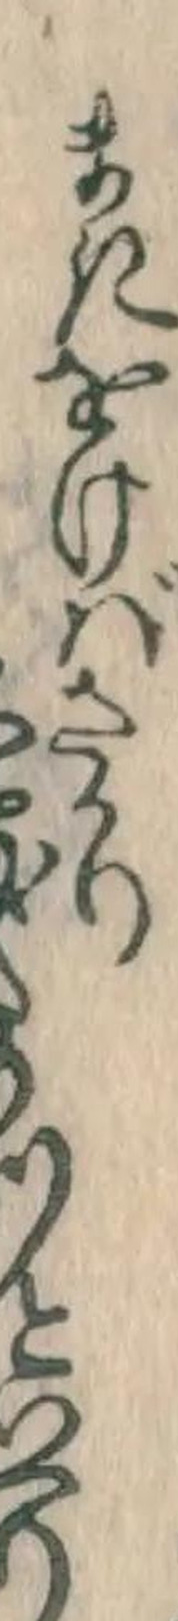まきをけばさかり
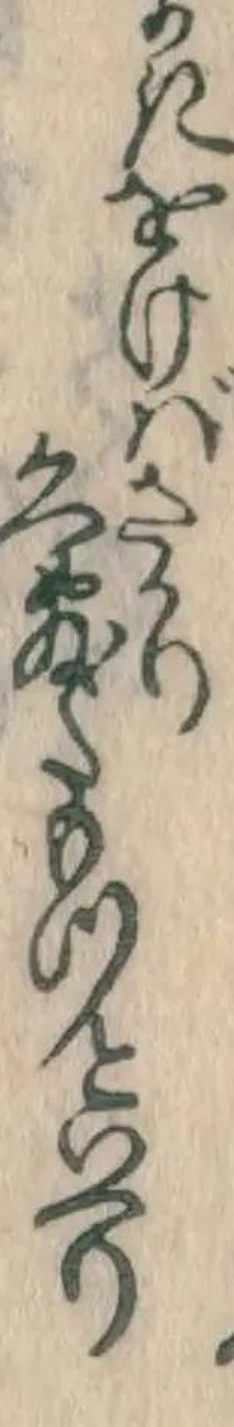久敷たもつといへり
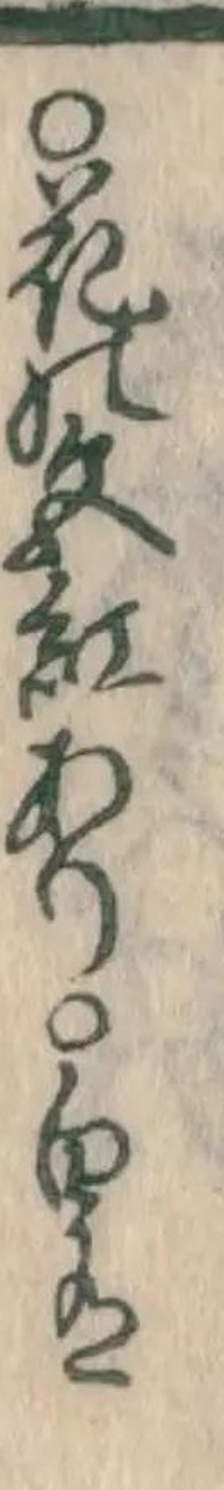〇花の色紅あり〇白有
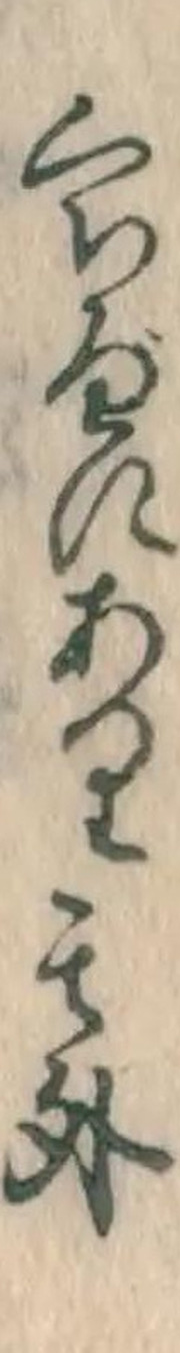くちべにあり其外
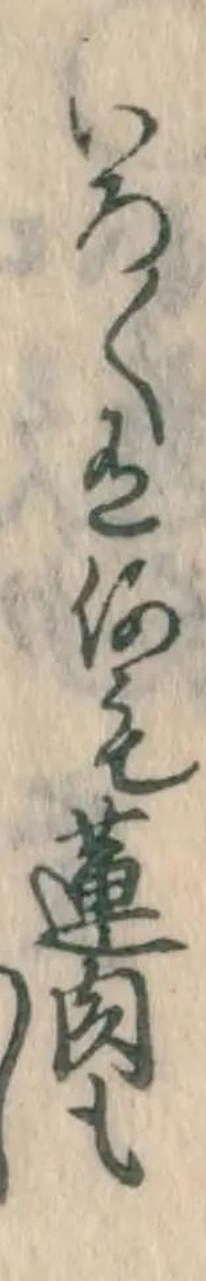いろ〳〵有何も蓮肉も
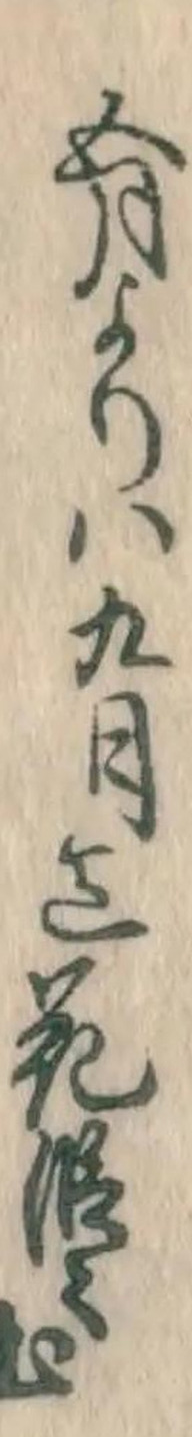五月より八九月迄花段々出
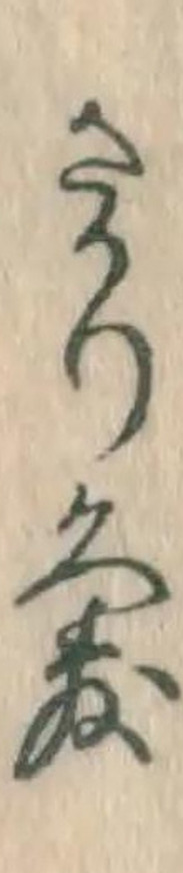さかり久敷
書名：艸花繪前集. [2]
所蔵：国立国会図書館 National Diet Library, JAPAN
